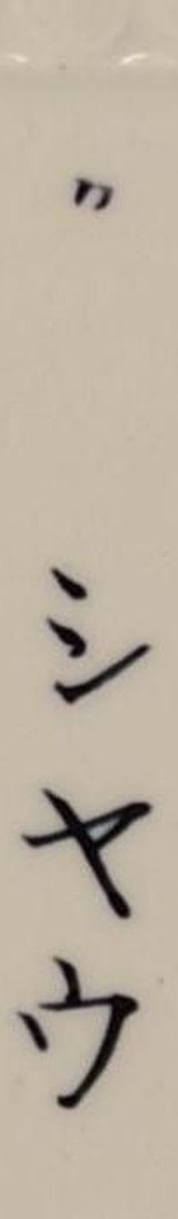シヤウ
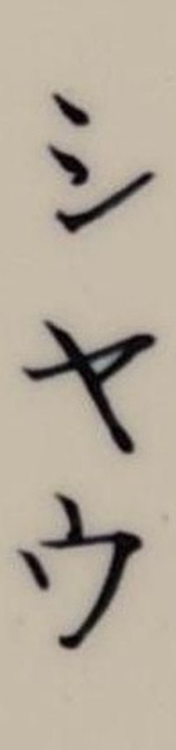シヤウ
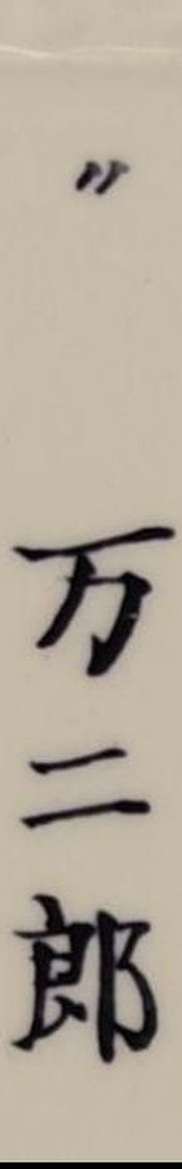万二郎
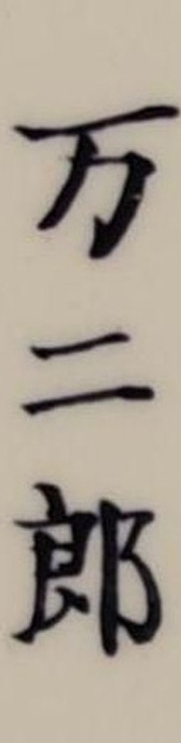万二郎

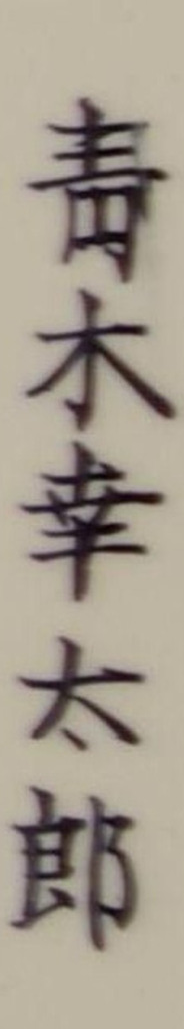青木幸太郎
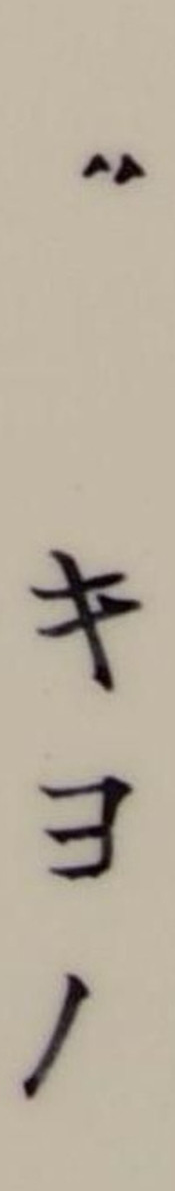キヨノ
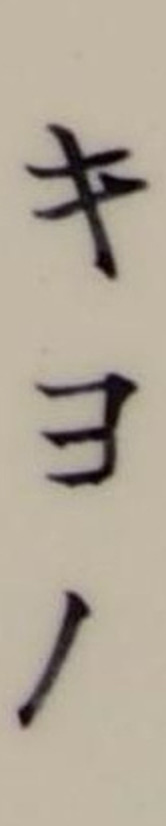キヨノ
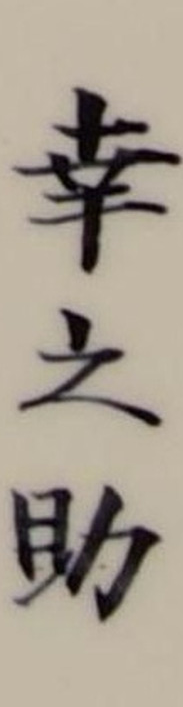幸之助
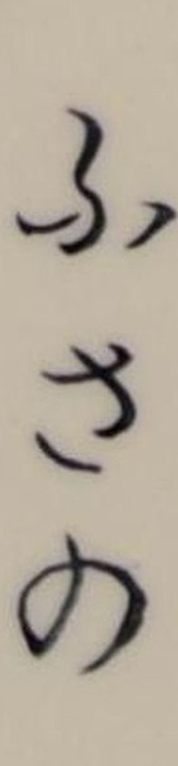ふさの
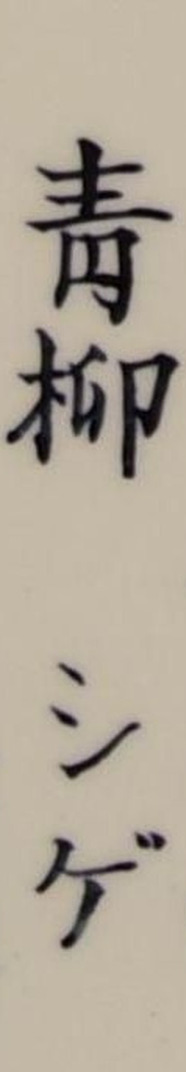青柳シゲ
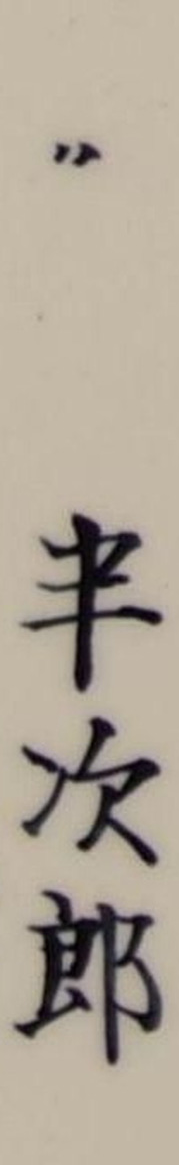半次郎
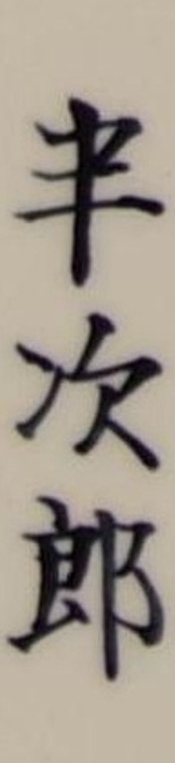半次郎
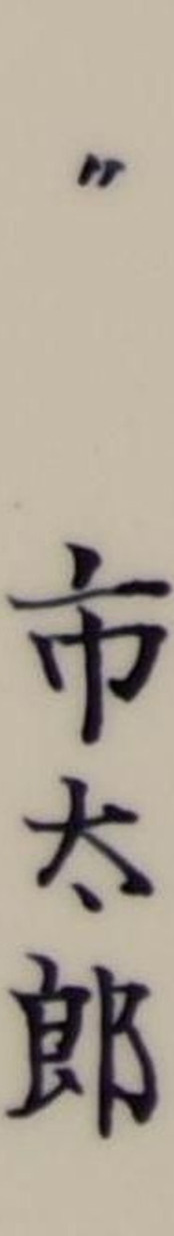市太郎
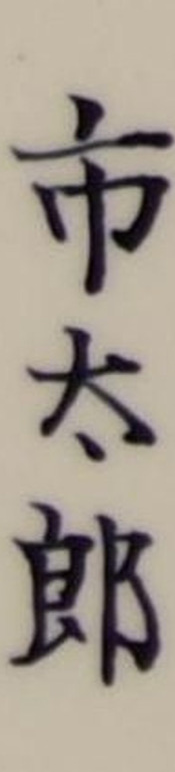市太郎
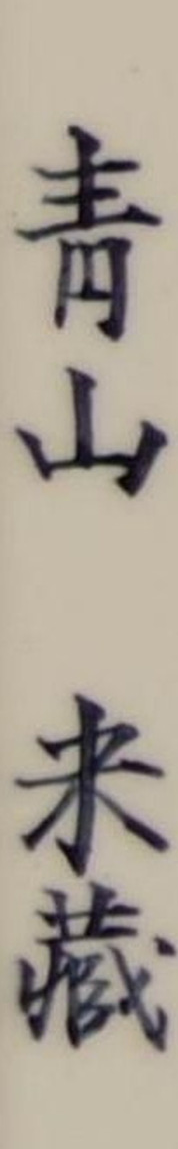青山米蔵

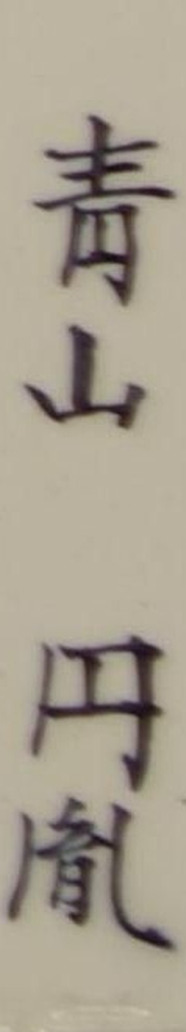青山円胤
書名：E~L
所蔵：高野山金剛峯寺
